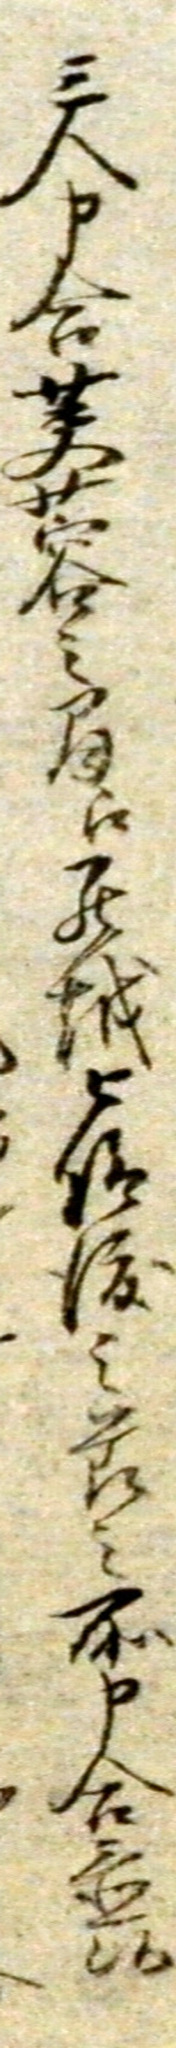三人申合芙蓉之間江罷越被仰渡之節之所申合候
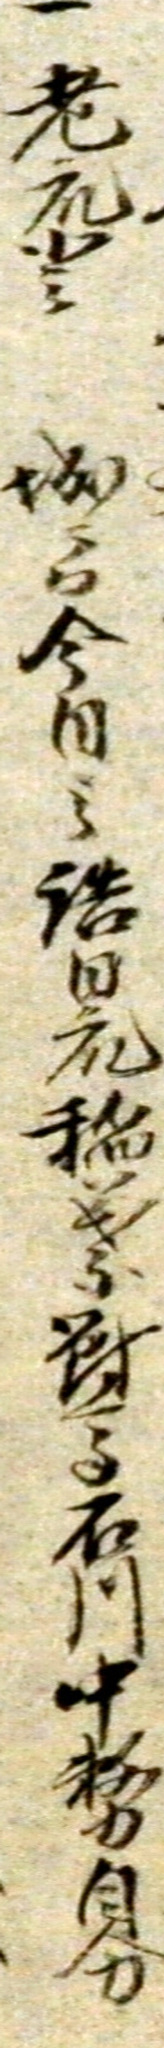一老衆登城ニ付今日之詰日衆稲葉対馬石川中務自分
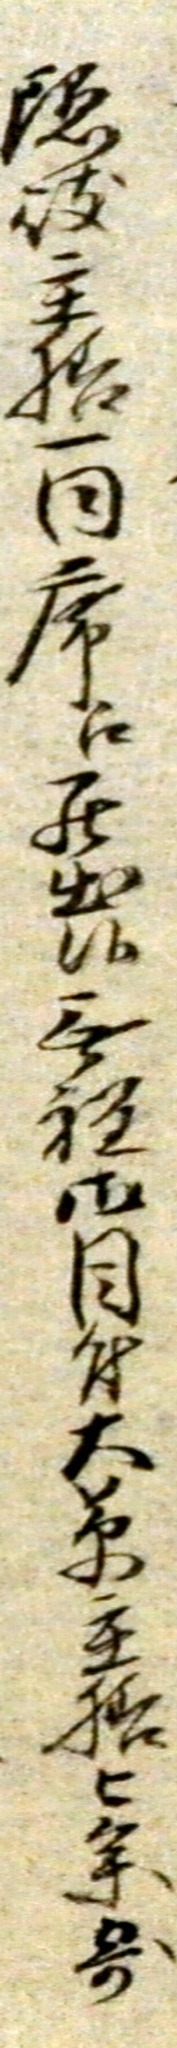隠岐主膳一同席江罷出候無程御目付大草主膳被参寄
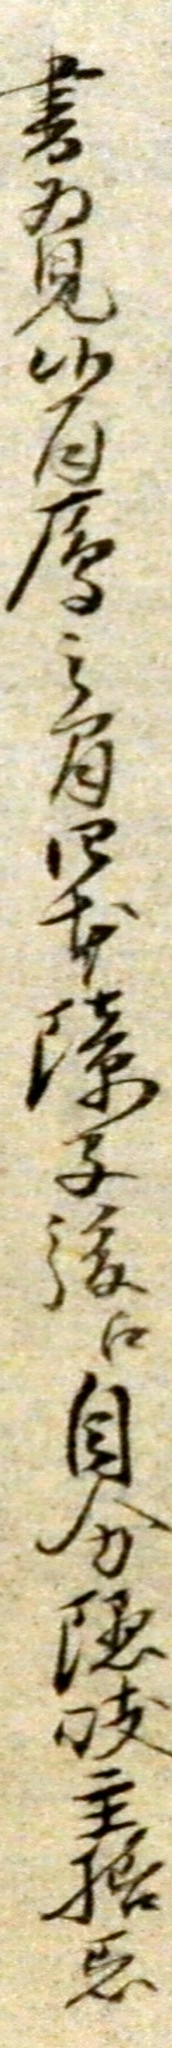書為見候間雁之四本障子後江自分隠岐主膳着座
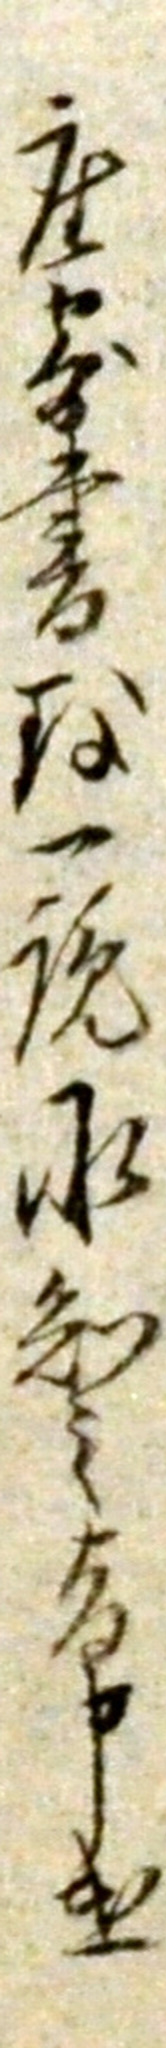寄書致一読承知之旨申遣

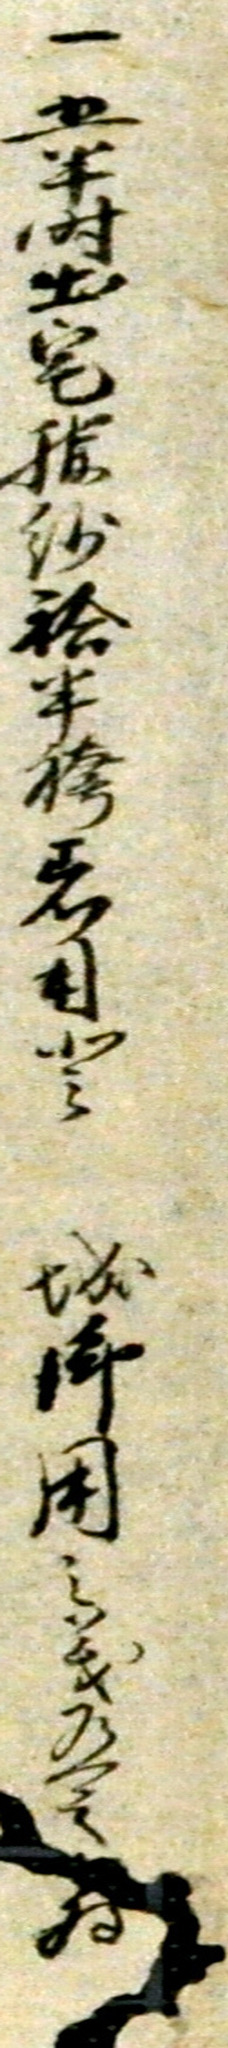一五半時出宅服紗袷半袴着用登城御用之儀有之候二付
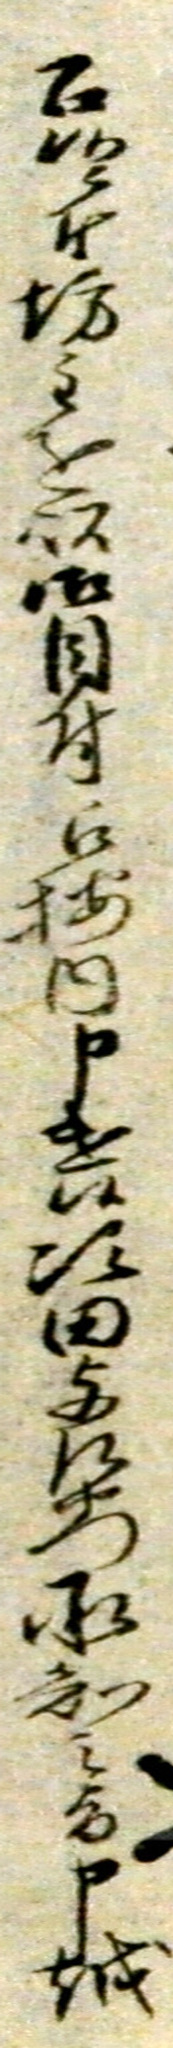召候二付坊主を以御目付按内申遣候須田与左衛門承知之旨申越
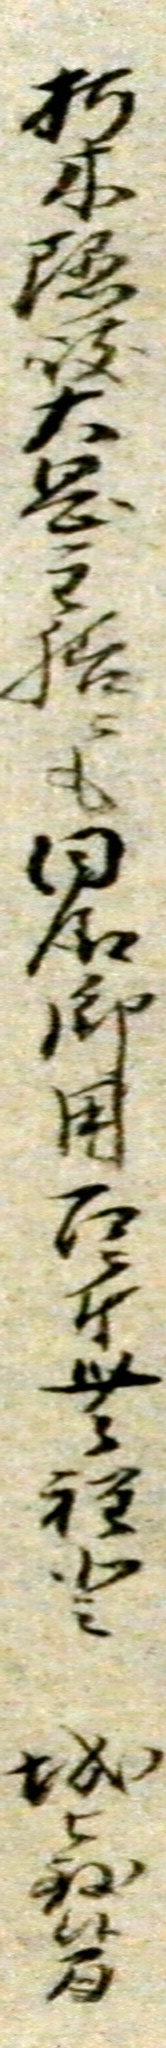朽木隠岐大岡主膳ニも同様御用召二付無程登城被致候間
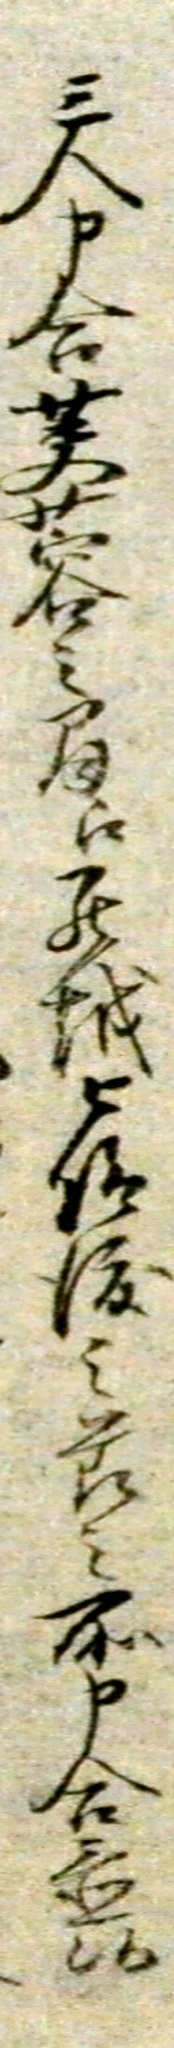三人申合芙蓉之江罷越被仰渡之節之所申合置候
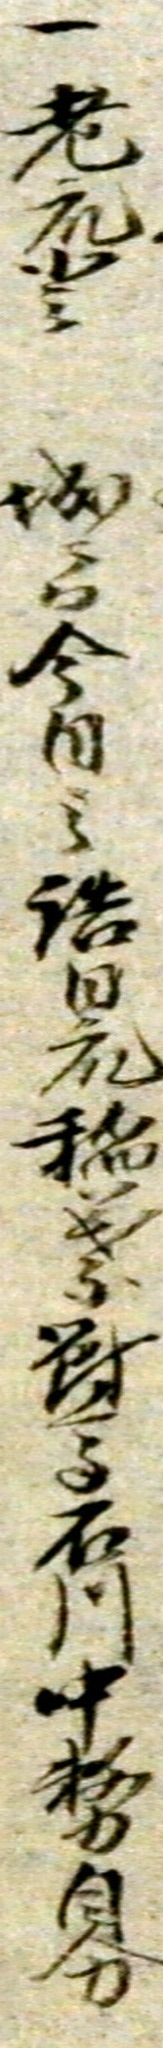一老衆登城ニ而今日之詰日衆稲葉対馬石川中務自分
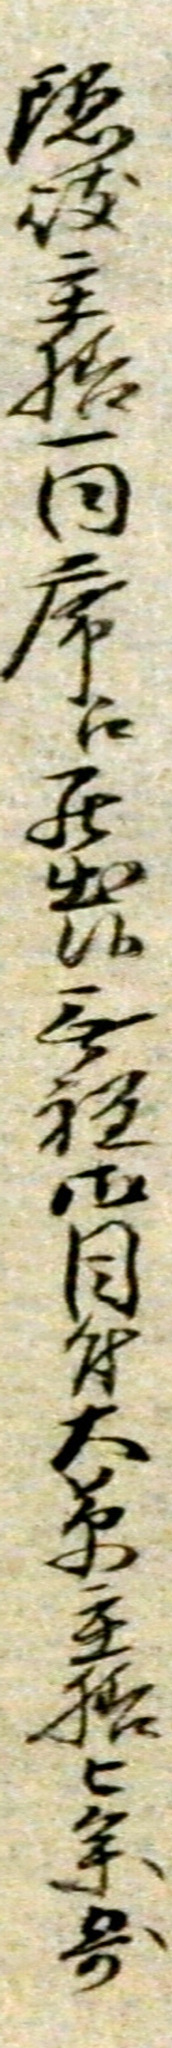隠岐主膳一同席江罷出候無程御目付大草主膳被寄書
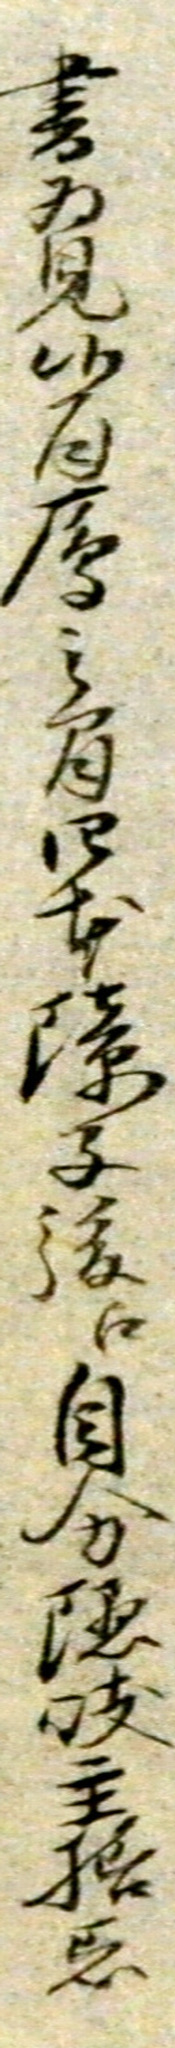為見候間雁之間四本障子後江自分隠岐主膳着
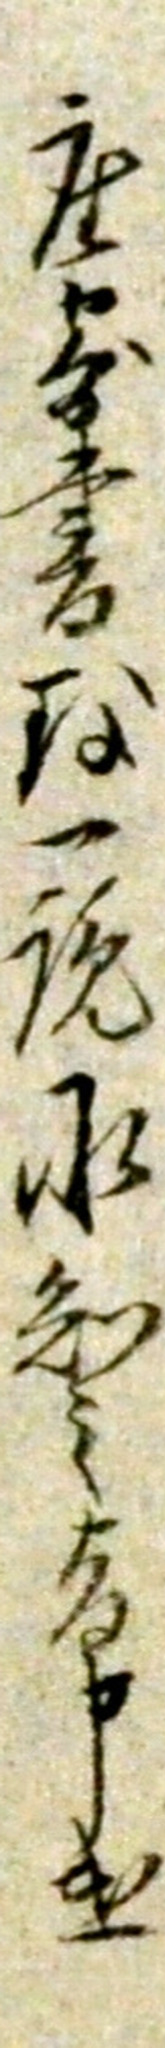座寄書致一読承知之旨申遣
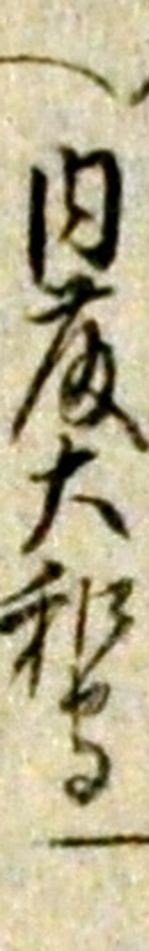内藤大和守
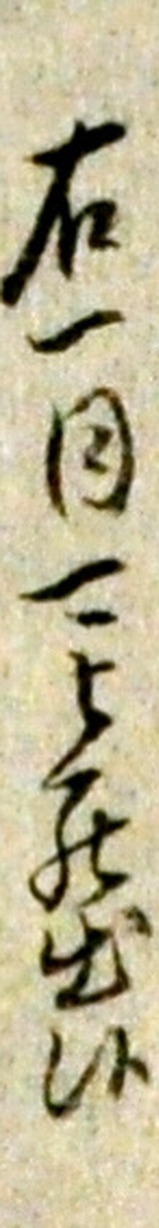右一同可被罷出候
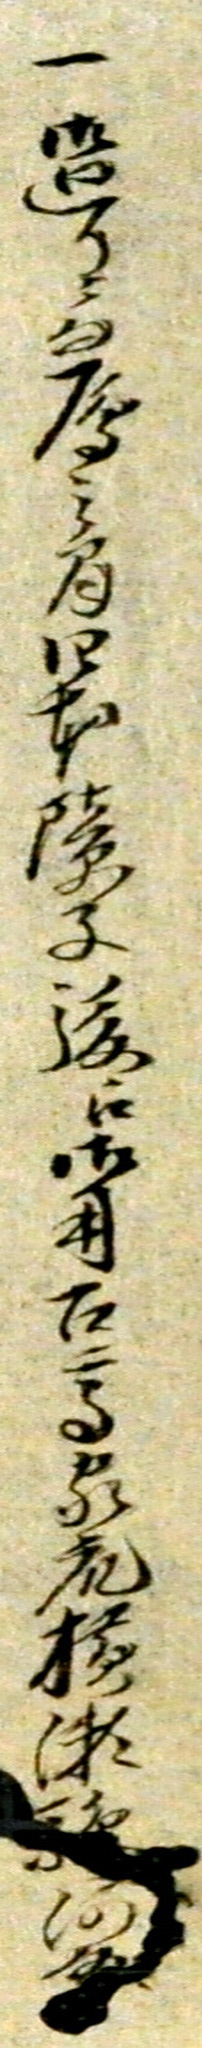一御廻ニ而雁之間四本障子後江御用召高家老衆横瀬駿河殿
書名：日光御名代相勤候節ノ留
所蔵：伊那市立高遠町図書館・合同会社AMANE
